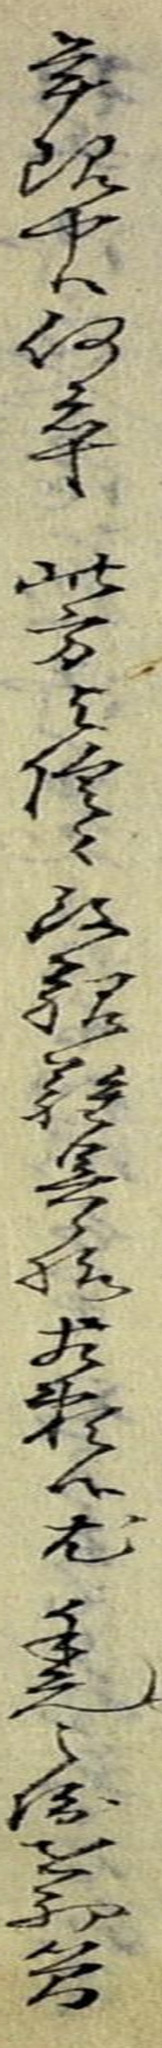年限中は何卒此方と侭々致艱難呉候様相頼候尤手元之儀を初簡
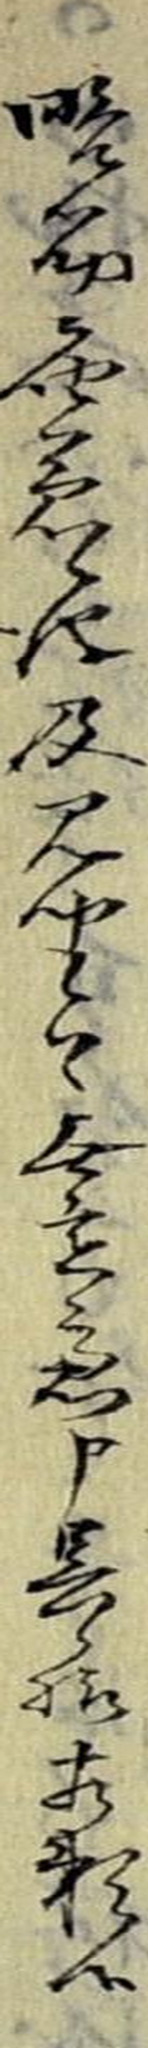略筋届兼候儀及見聞候はヽ無遠慮申呉候様相頼候
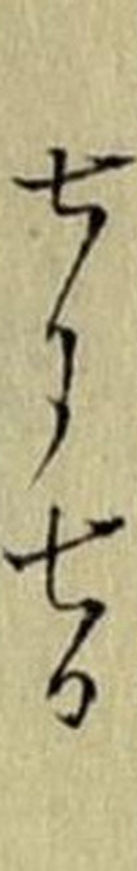七月七日
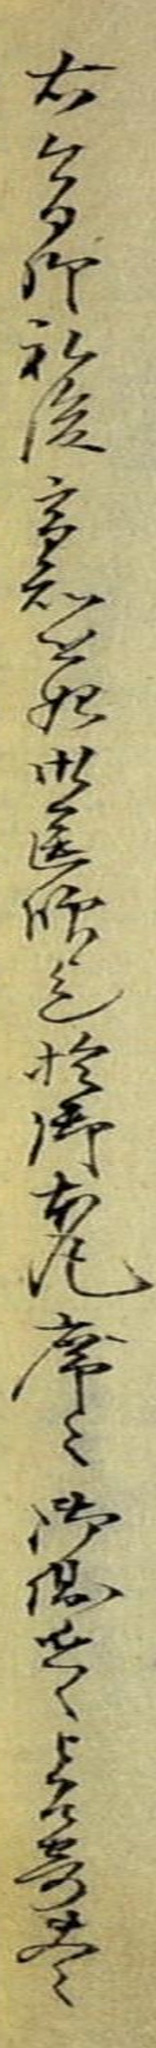右今日御礼後高知を始御医師迄於御本丸席々御側近く被召寄夫々
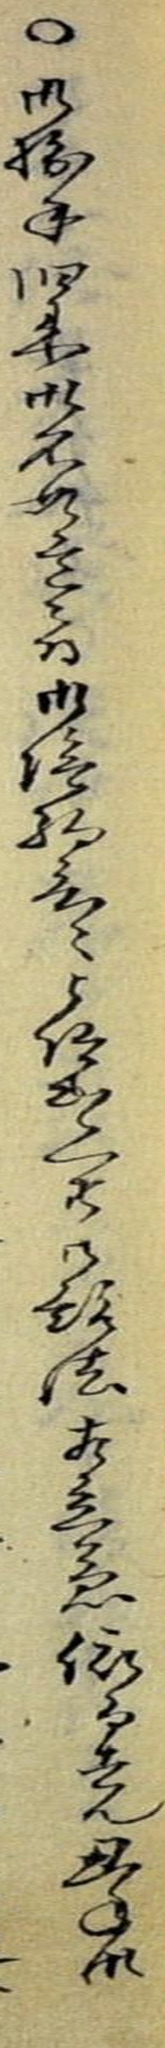○御勝手旧來御不如意に付御倹約度々被仰出候へ共御趣法相立兼依而去ル丑年御
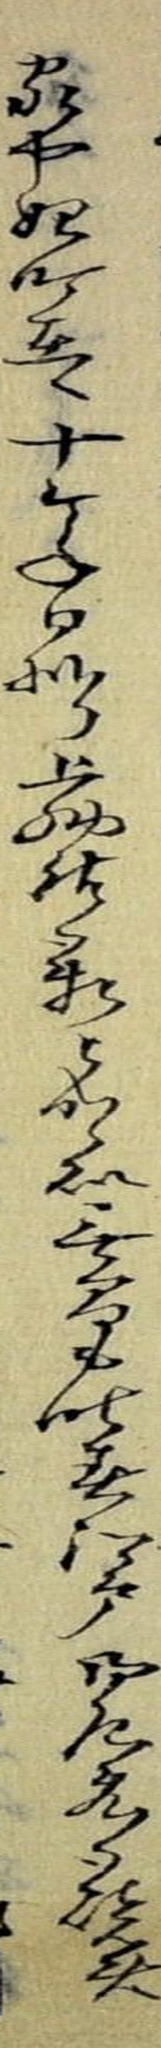家中始町在へ十ヶ年日掛り上納銀御頼被成候処無間も昨春江戸御屋敷御焼失
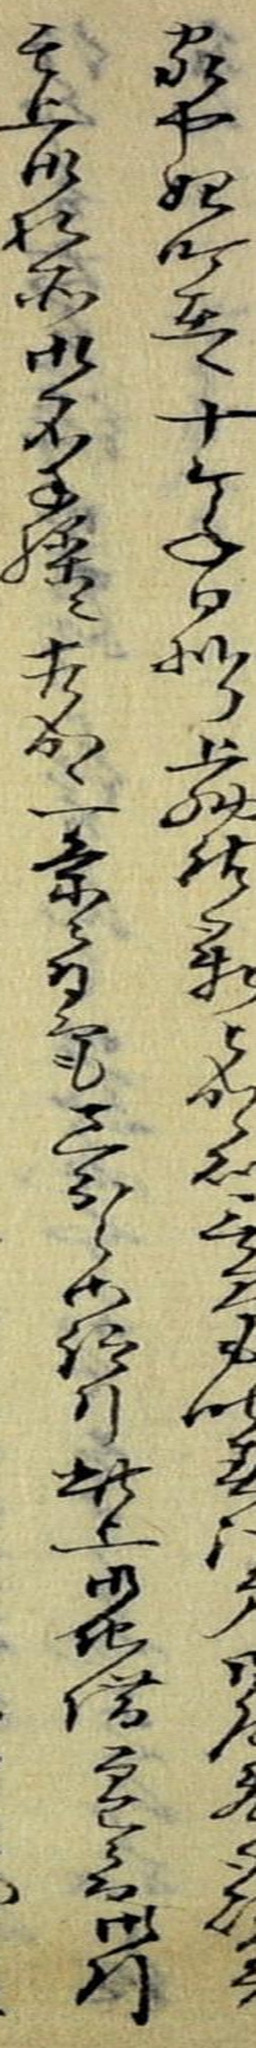其上御札所御不手繰に相成候一条に付而も過分之御跡引此上御他借而己に而御引
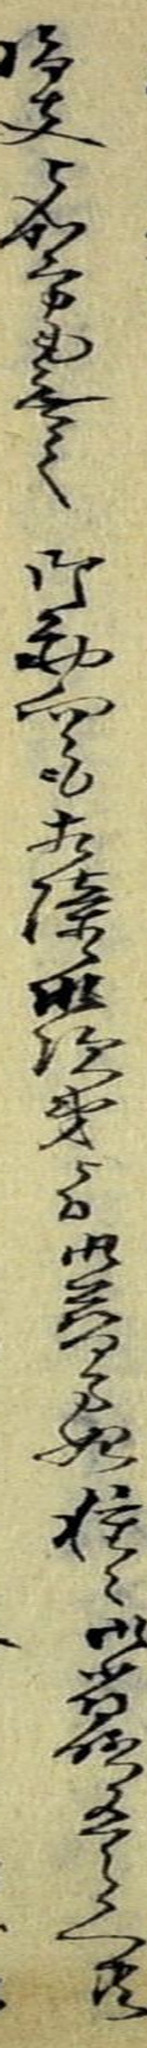指支被成方も無之御勤向にも相障候御次第に付御暮方始種々御省略有之候へ共
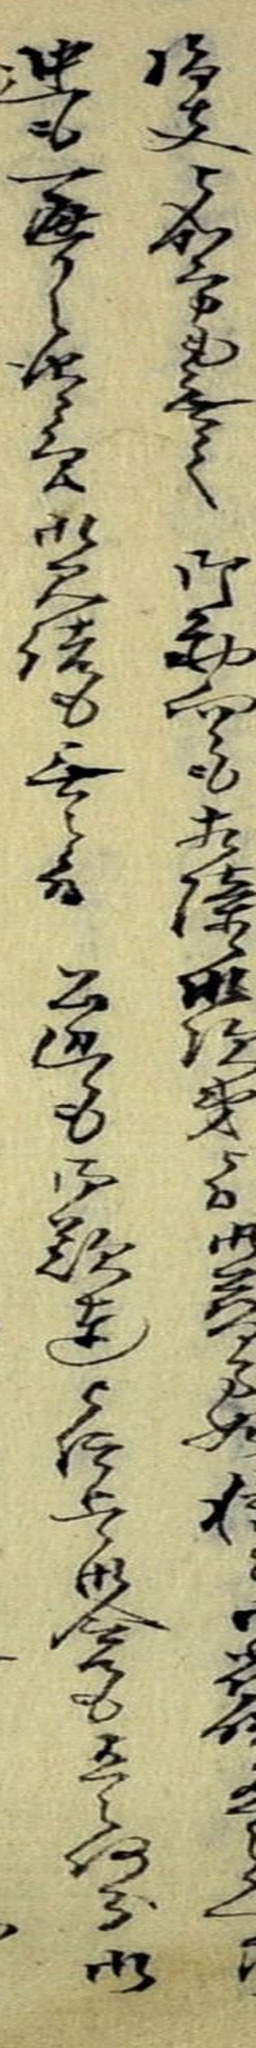迚も一通り之儀に候而は御見詰も無之に付公辺へも御歎達被仰上候御会も有之何分御
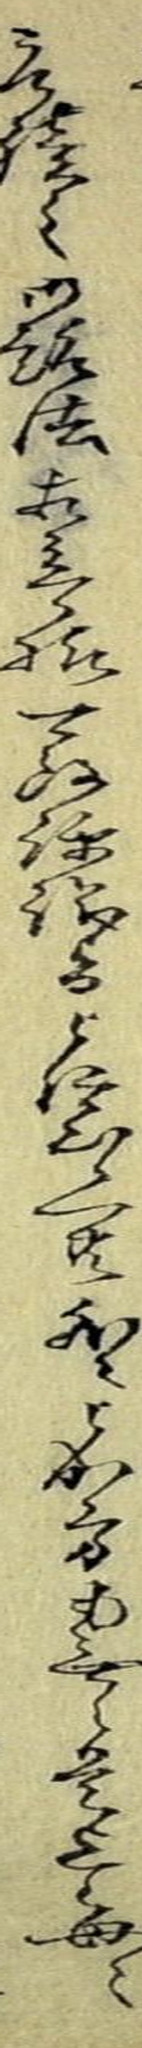取続之御趣法相立候様可致評議旨被仰出候へ共外に被成方も無之是迄毎々
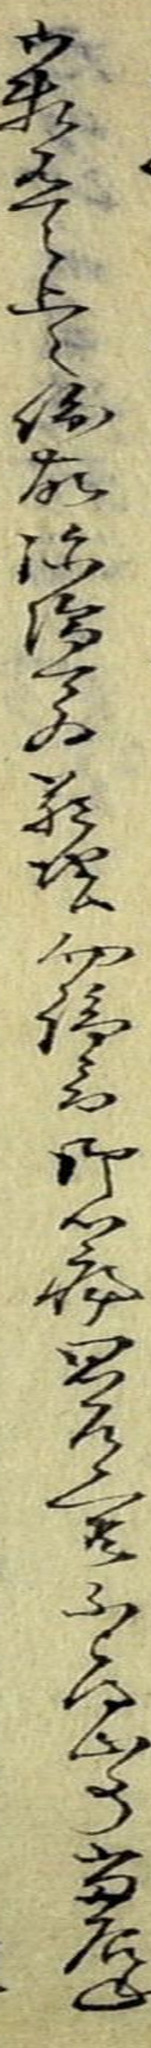御頼有之上之儀故弥増可為難儀は勿論に而御心痛思召候へ共不被得止事当辰年
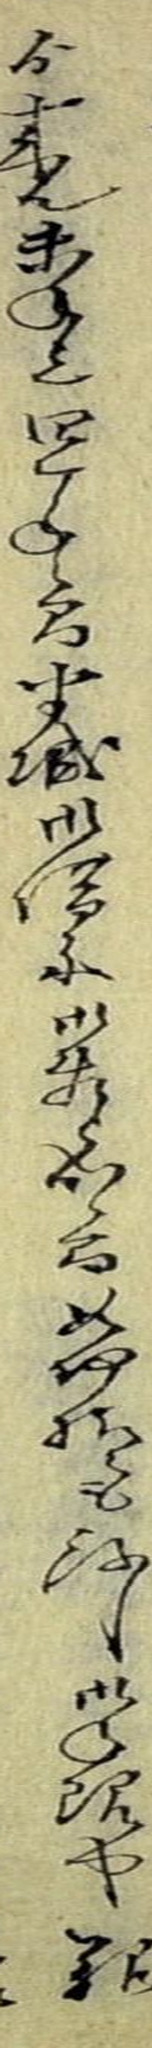ゟ来ル未年迄四ヶ年之間半減御借米御頼被成候間如何様にも致し御年限中艱
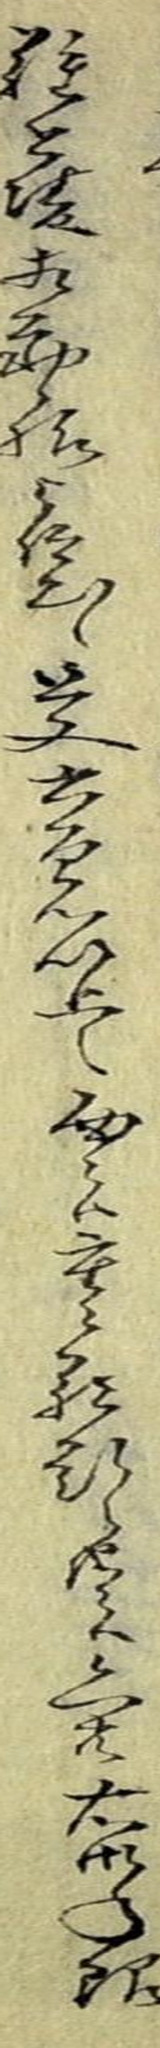難を凌相勤候様被仰出候且又六百石以上之面々は重々難題之儀には候へ共右御年限
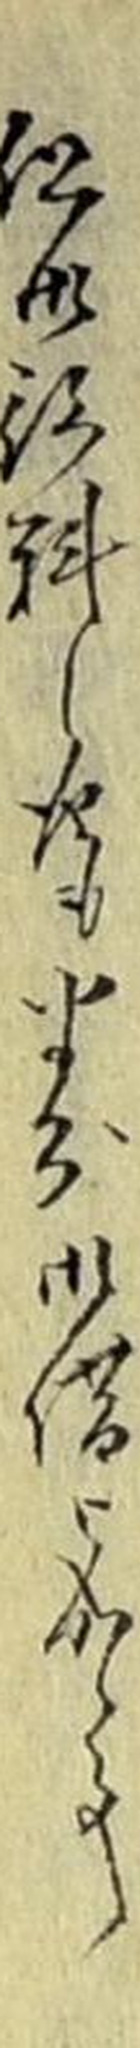但御役料之儀も半分御借被成候事
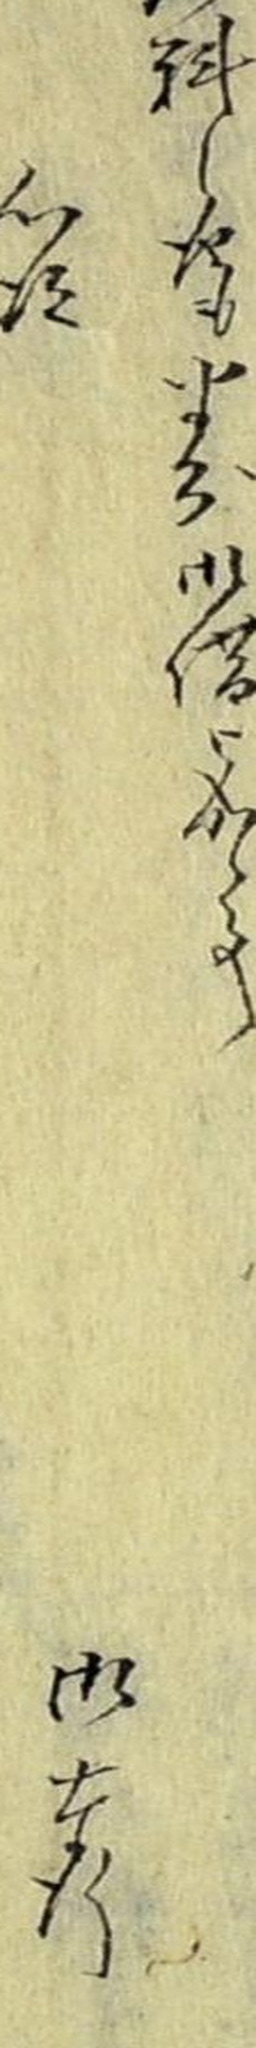心得御奉行
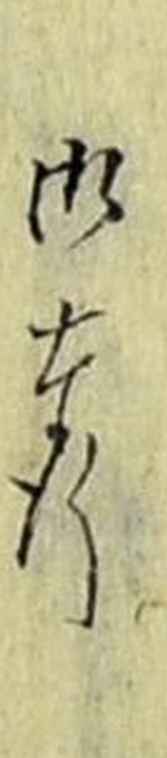御奉行
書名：命令之部 六
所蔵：福井県文書館 Fukui Prefectural Archives
